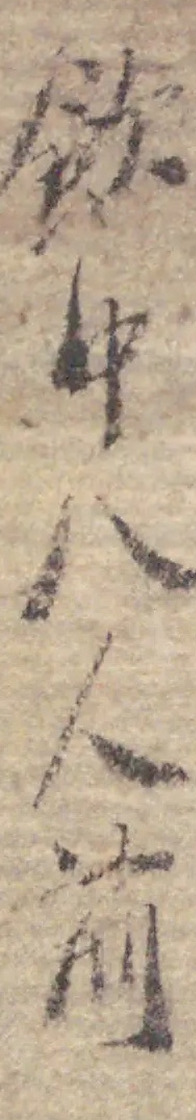飲中八人前

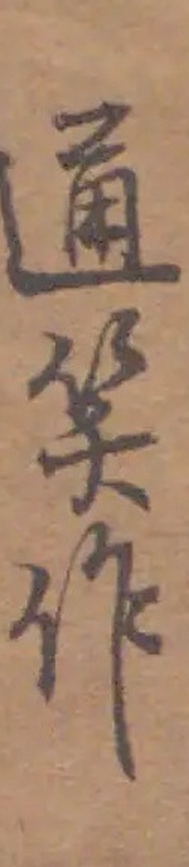通笑作
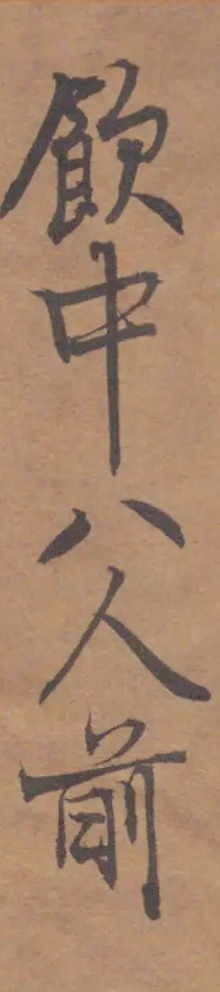飲中八人前
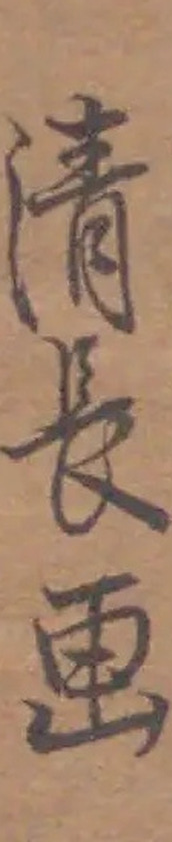清長画

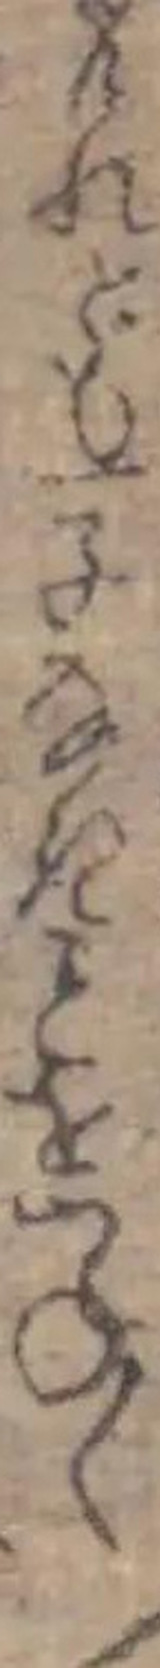なけれども一子なきことをつね〳〵
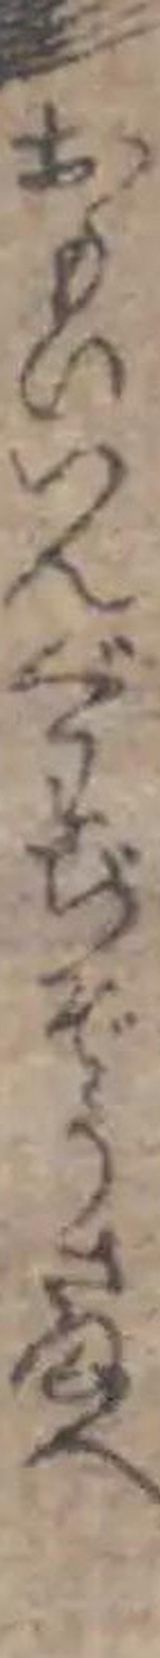おもいいんぐわぢぞうさまへ
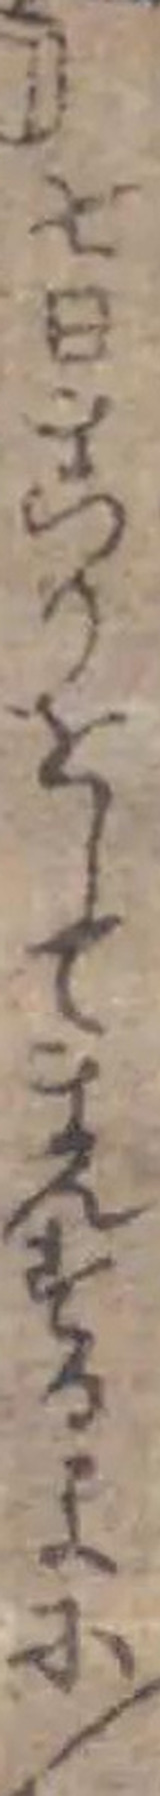七日まいりをしてまんするよに
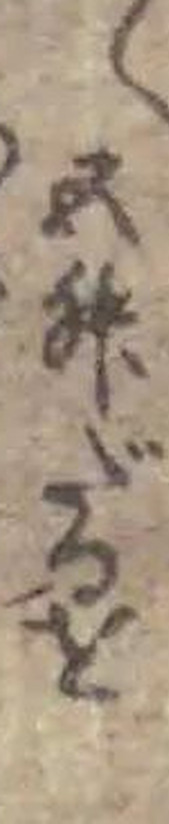五升だるを
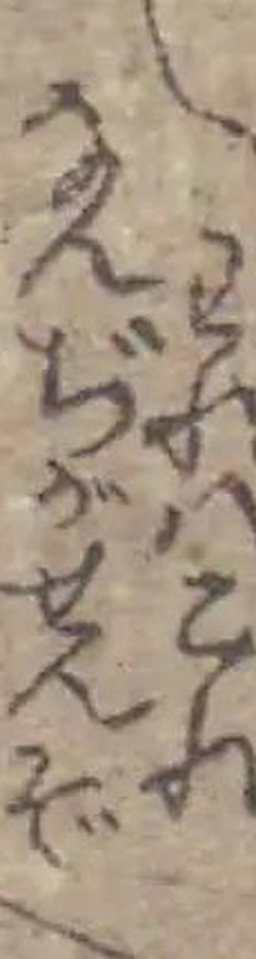なんぢがせんぞ
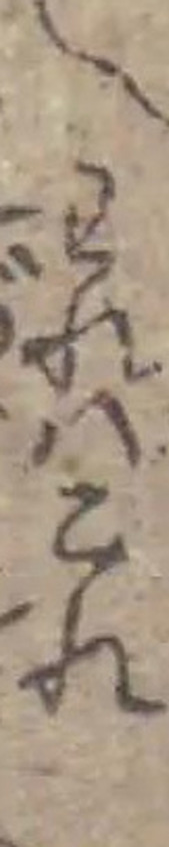われはこれ
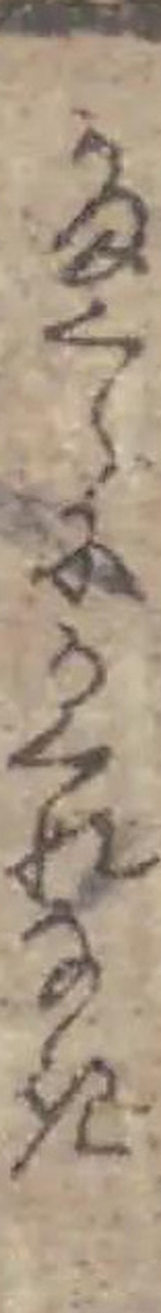かまくらにかくれなき
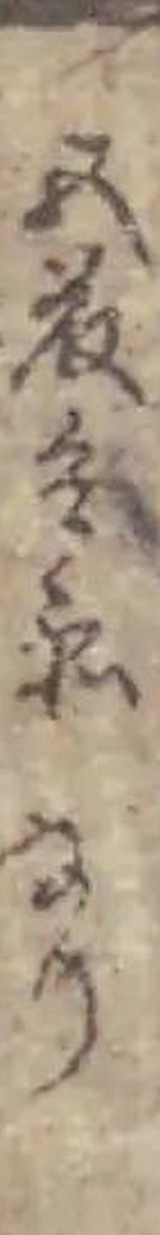五藤兵衛なり
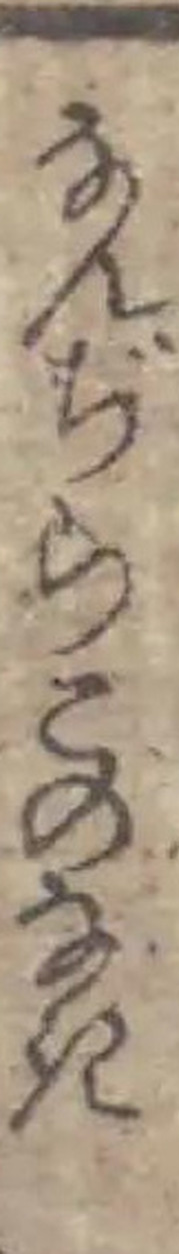なんぢらこのなき
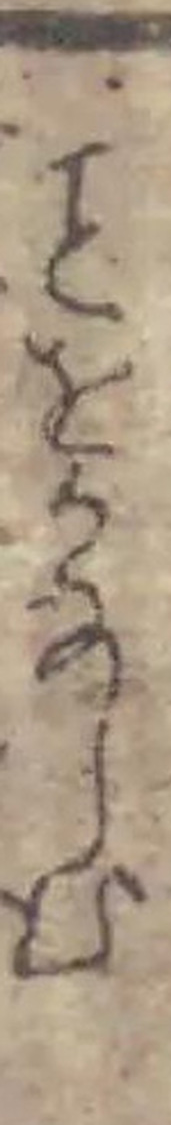ことをかなしむ
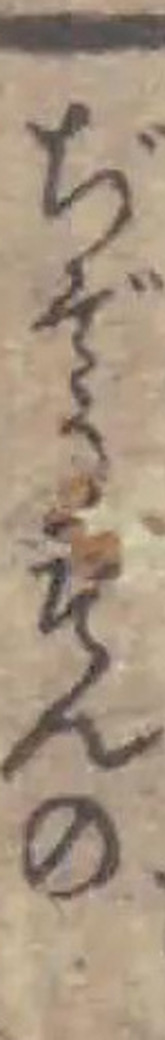ぢぞうそんの
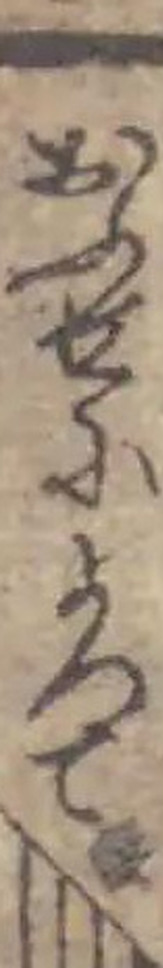おふせによつて
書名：飲中八人前 3巻
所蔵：国立国会図書館 National Diet Library, JAPAN
